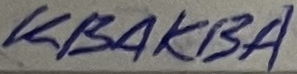кваква
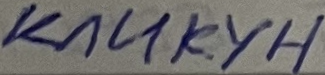кликун
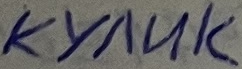кулик
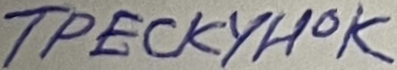трескунок
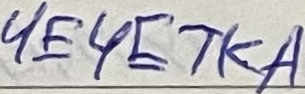чечетка
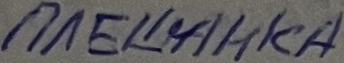плешанка
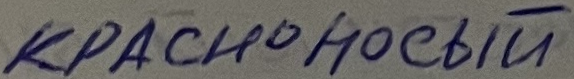красноносый
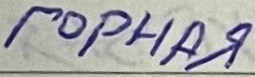горная
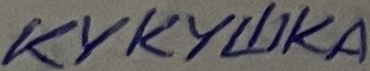кукушка
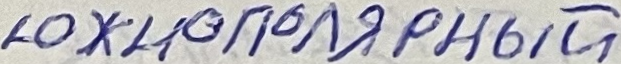южнополярный
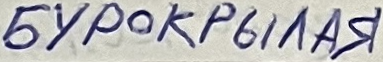бурокрылая
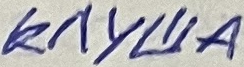клуша
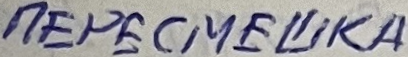пересмешка
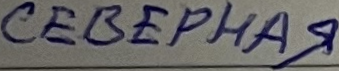северная
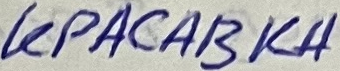красавка
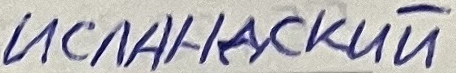исландский
